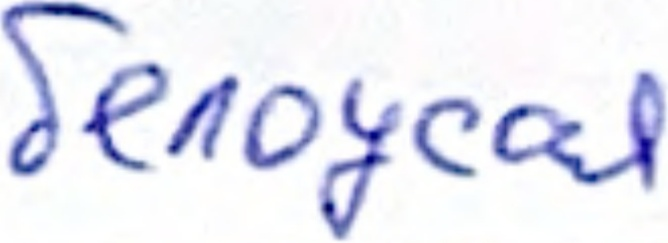белоусая
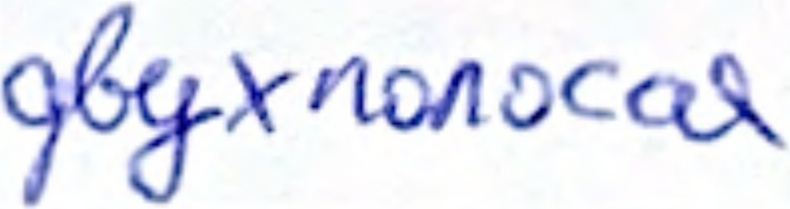двухполосая
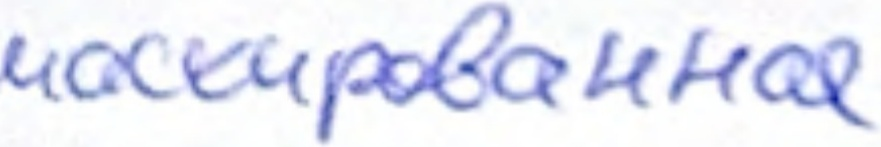маскированная
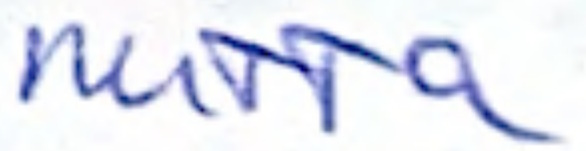питта
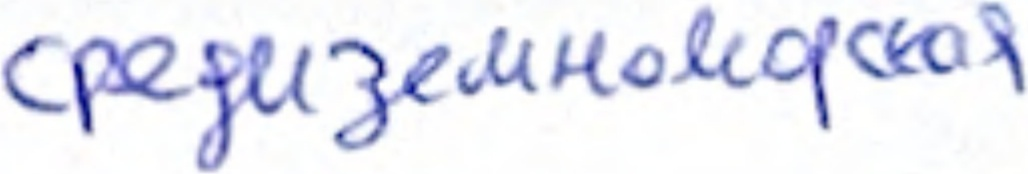средиземноморская
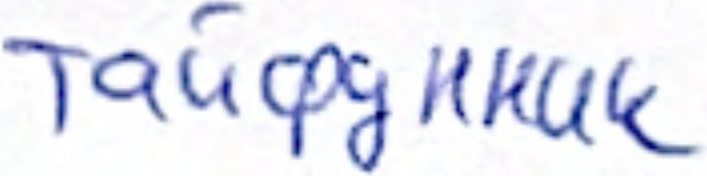тайфунник
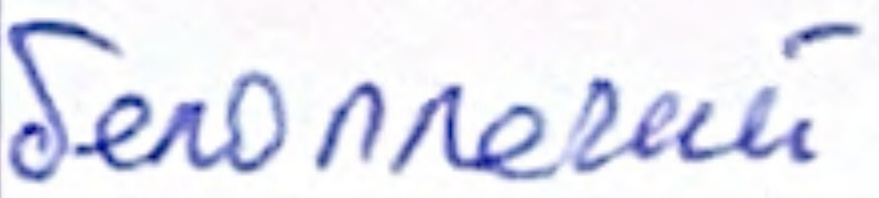белоплечий
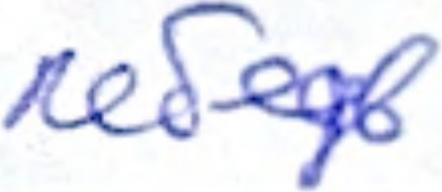лебедь
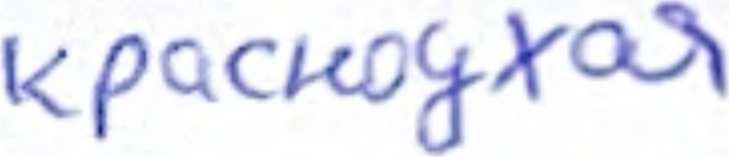красноухая
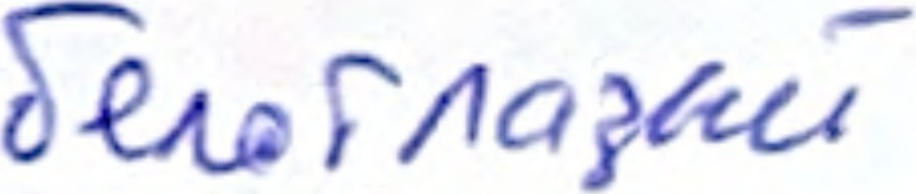белоглазый
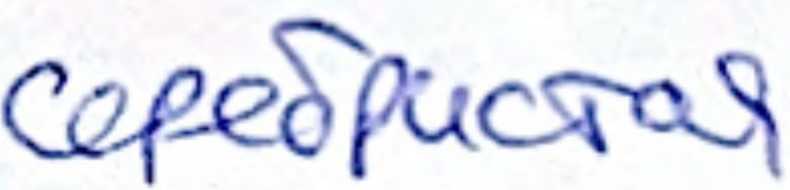серебристая
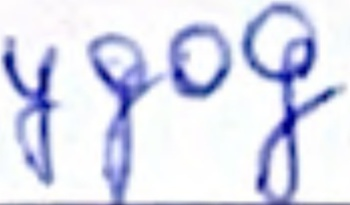удод
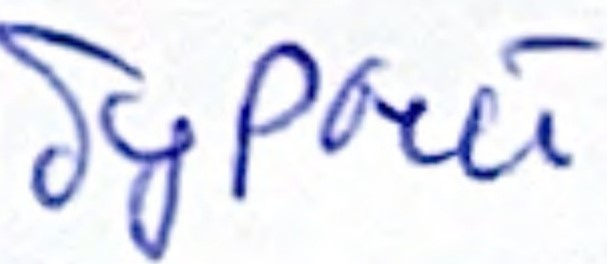бурый
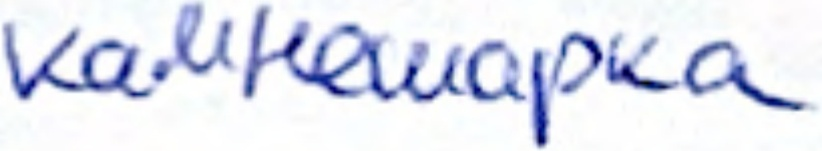камнешарка
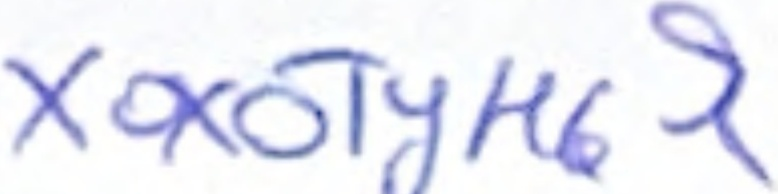хохотунья
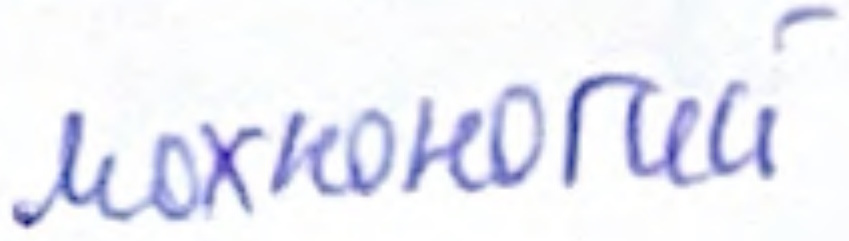мохноногий
